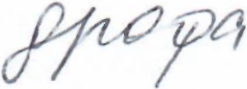дрофа
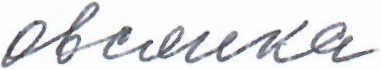овсянка
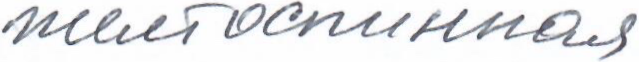желтоспинная
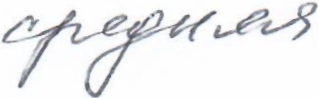средняя
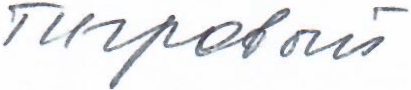тигровый
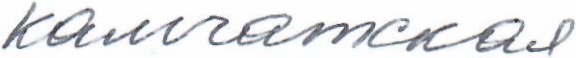камчатская
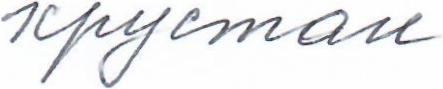хрустан
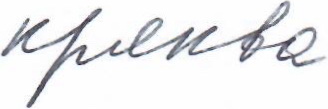кряква
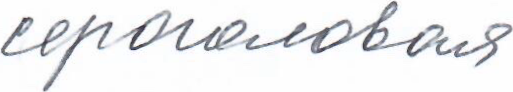сероголовая
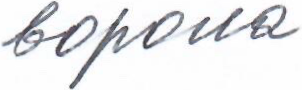ворона
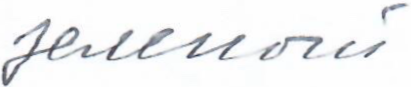зеленый
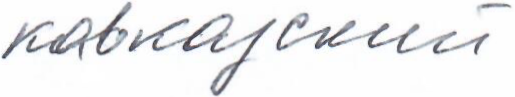кавказский
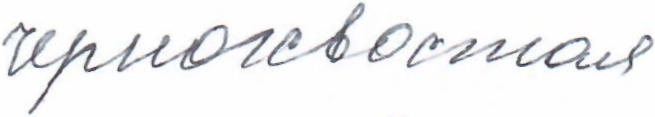чернохвостая
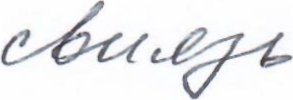свиязь
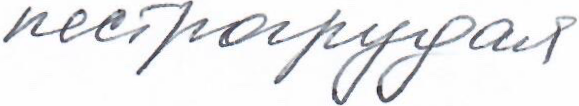пестрогрудая
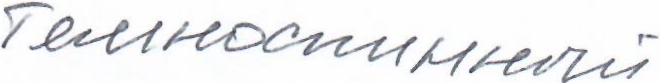темноспинный
